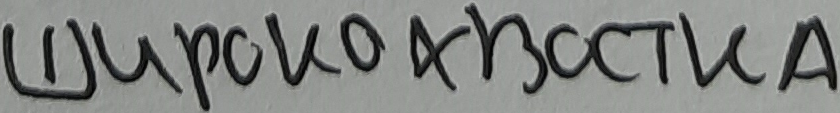широкохвостка
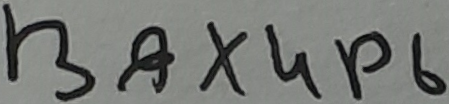вяхирь
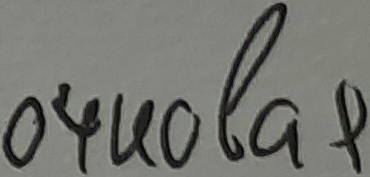очковая
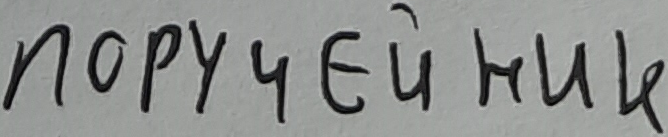поручейник
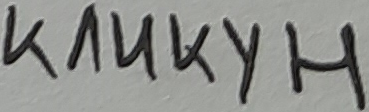кликун
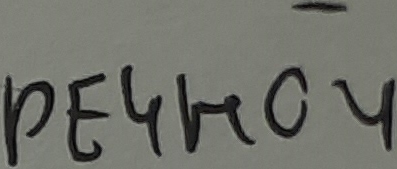речной
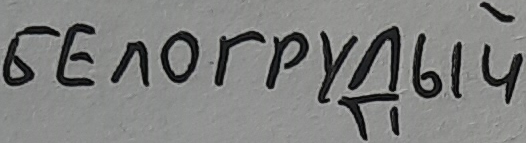белогрудый
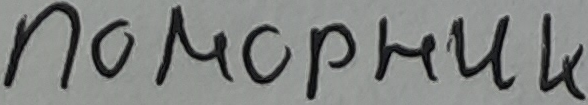поморник
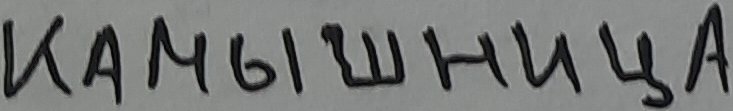камышница
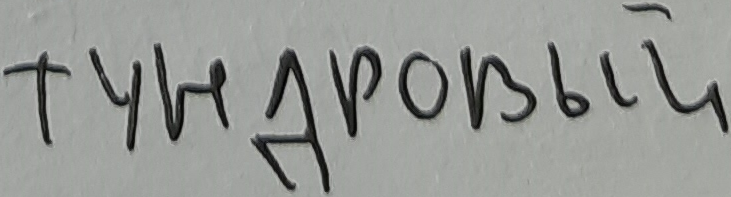тундровый
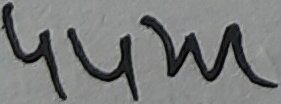чиж
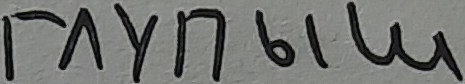глупыш
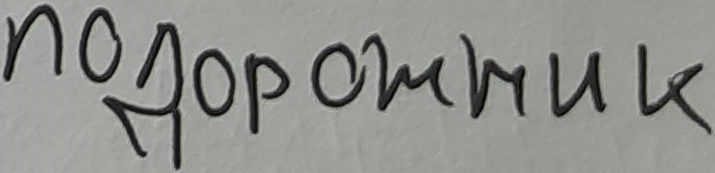подорожник
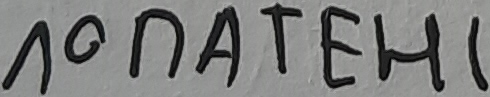лопатень
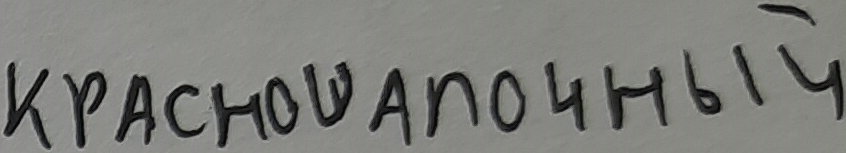красношапочный
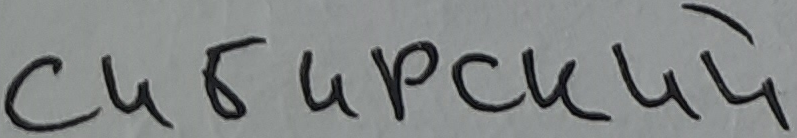сибирский
